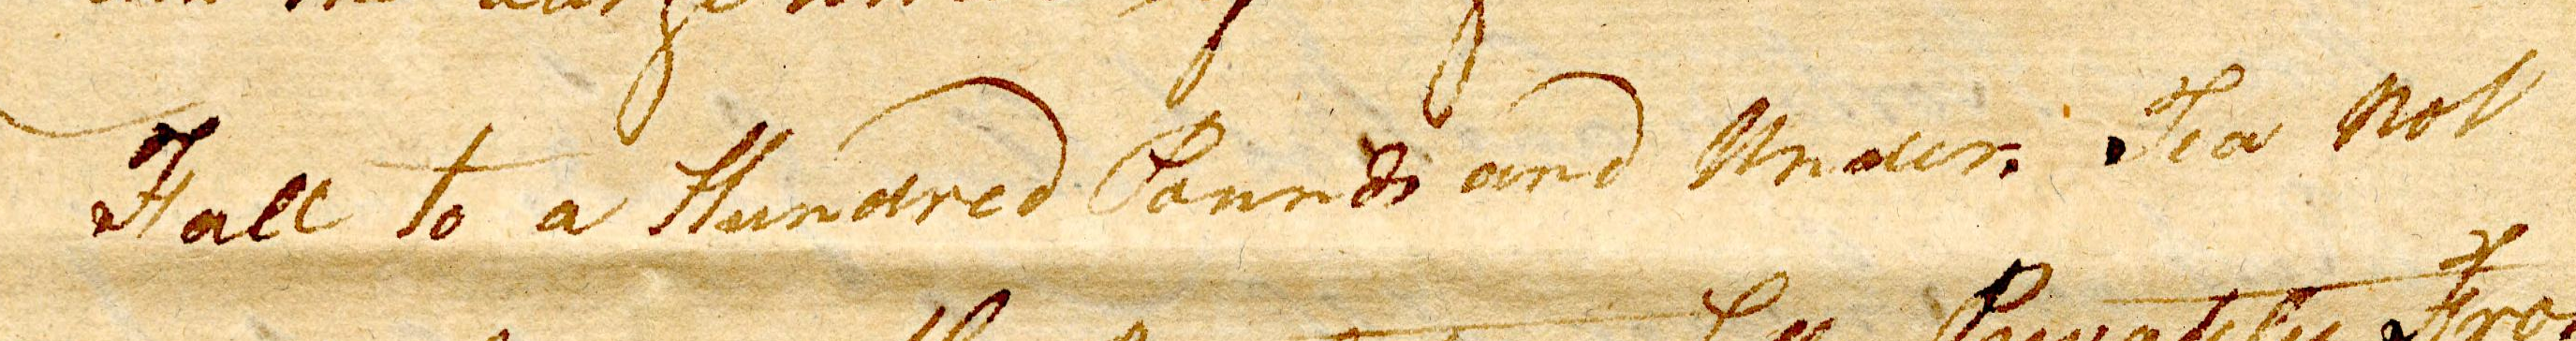Fall to a Hundred Pounds and Under. Tea not
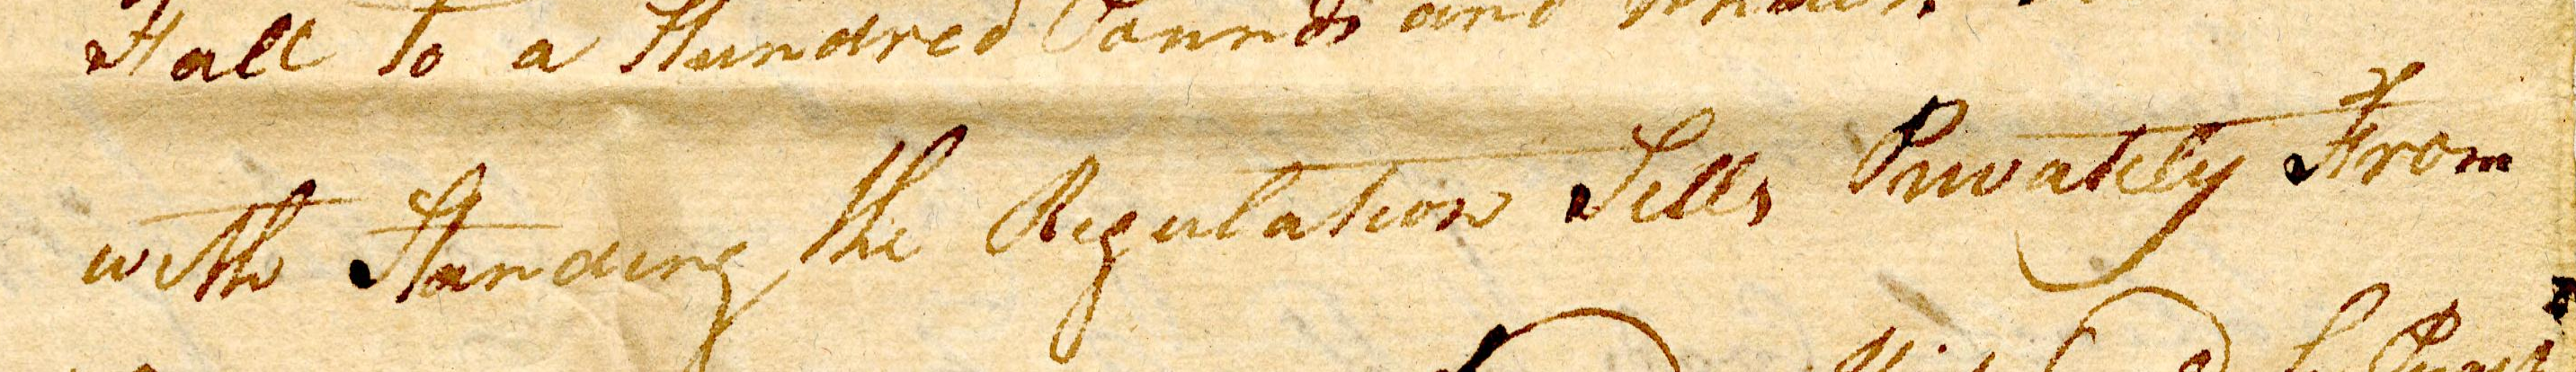with Standing the regulation sells Privately from
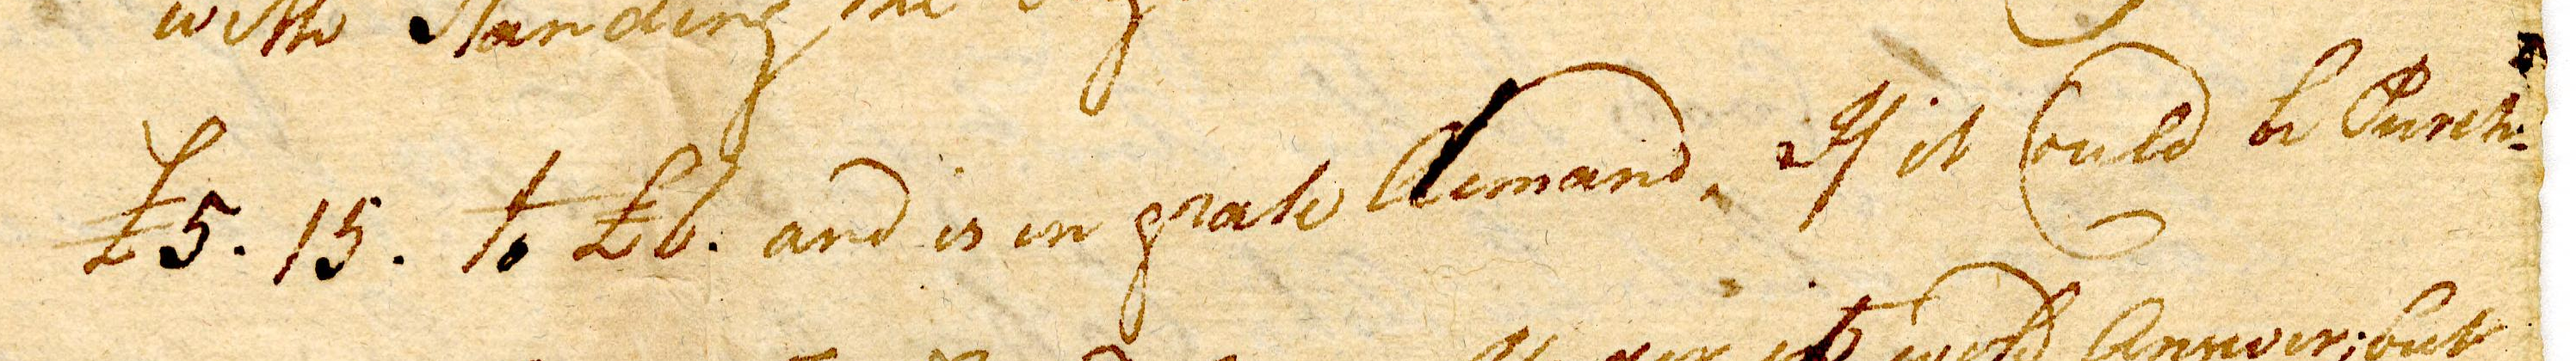£5. 15. to £6. and is in grate demand, if it could be Purch-
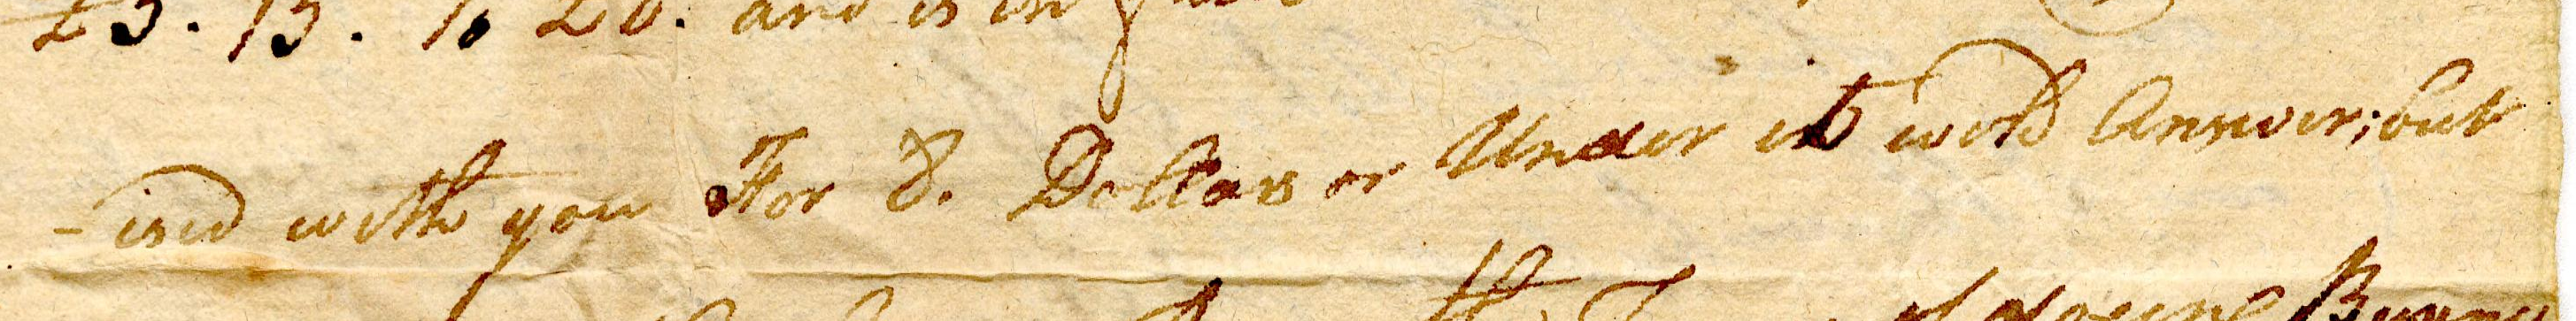-ised with you for 8. Dollars or Under it wold Answers; but
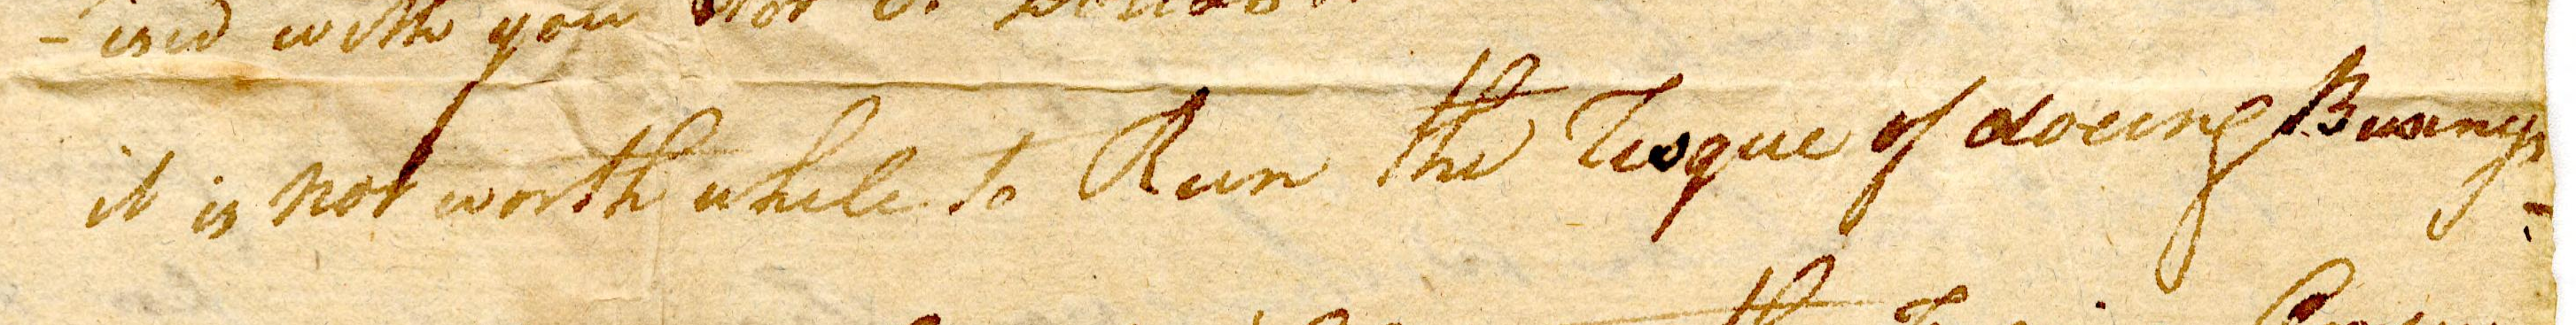it is not worth while to Run the risque of doeing Busenes
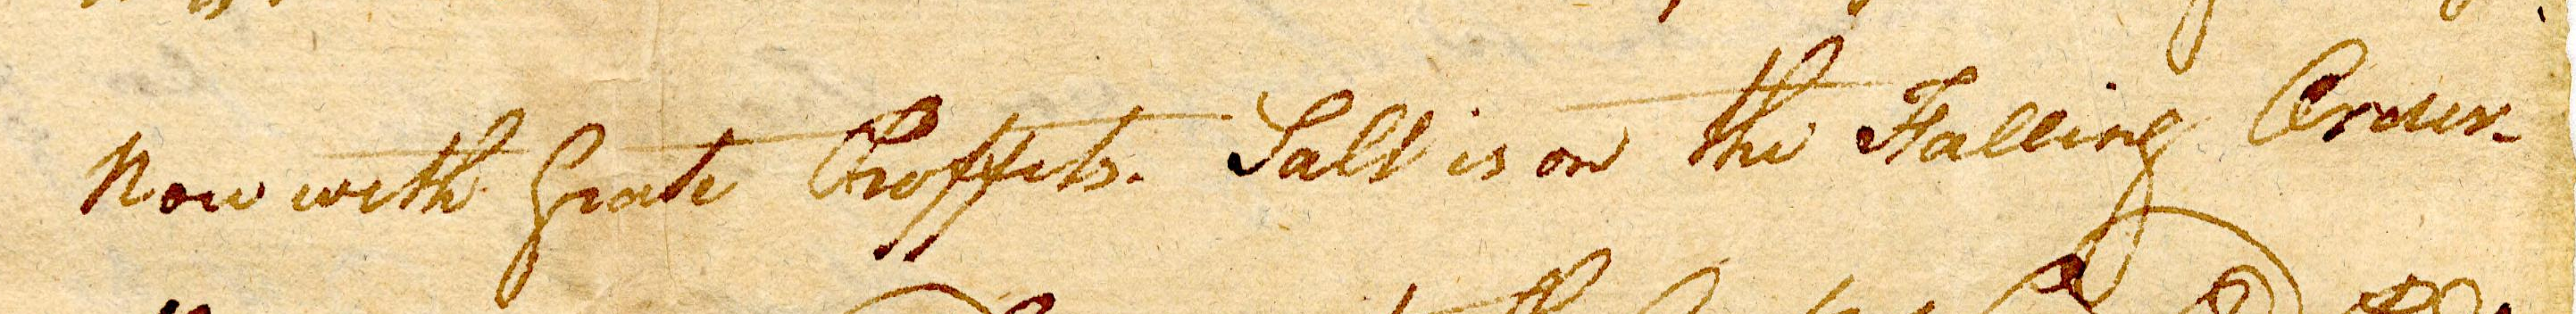now with grate proffits. Salt is on the Falling Prices.
